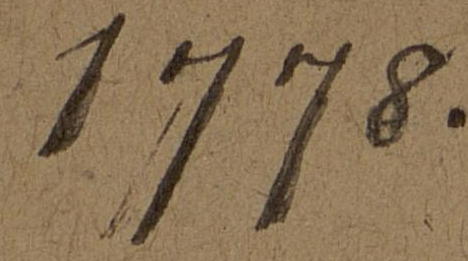1778
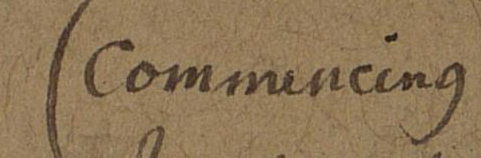Commencing
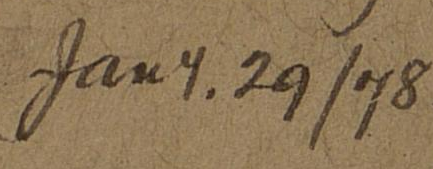Jan 4. 29/78.
